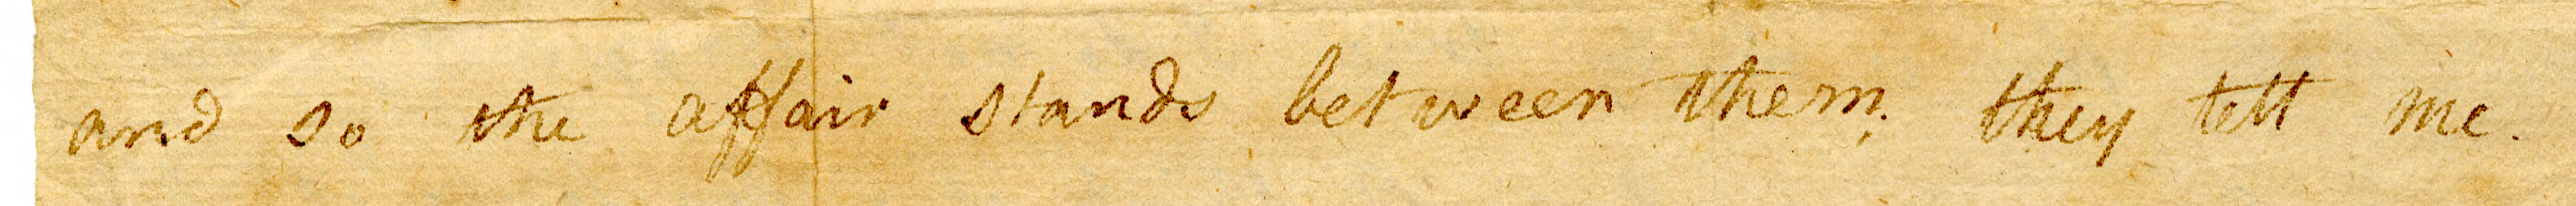and so the affair stands between them they tell me.
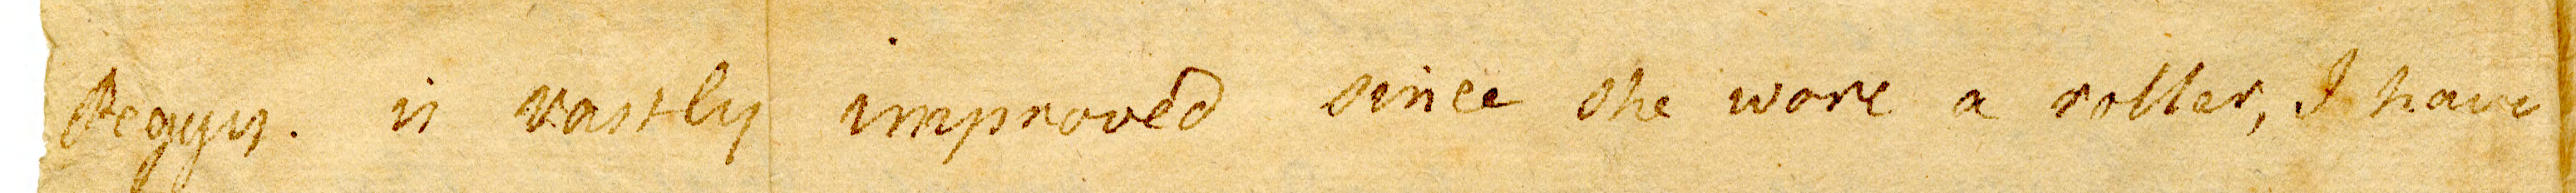Peggy is vastly improved since she wore a roller, I have
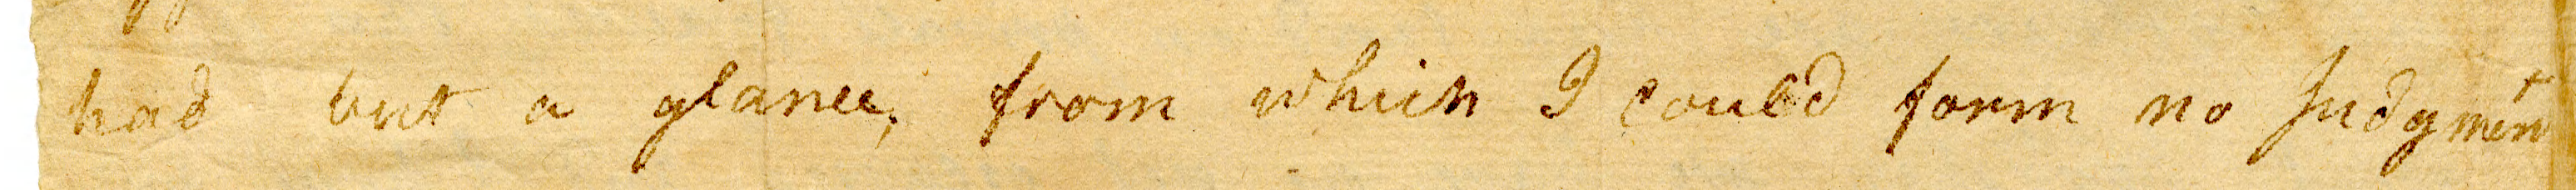had but a glance, from which I could form no Judgmen^t
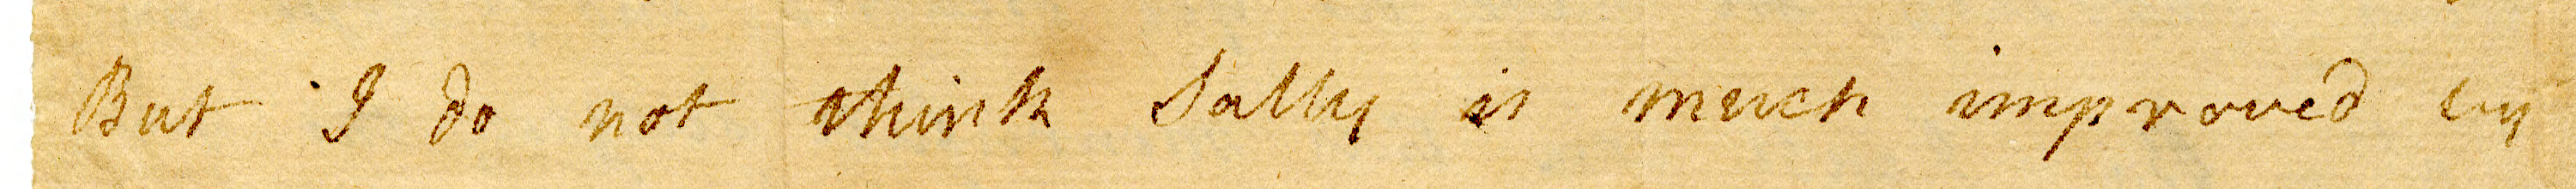But I do not think Sally is much improved by
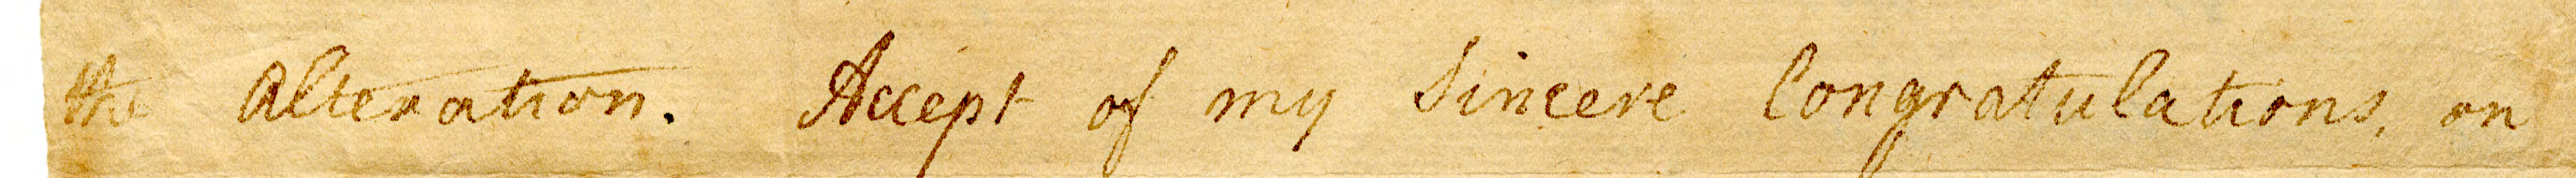the alteration. Accept of my Sincere Congratulations on
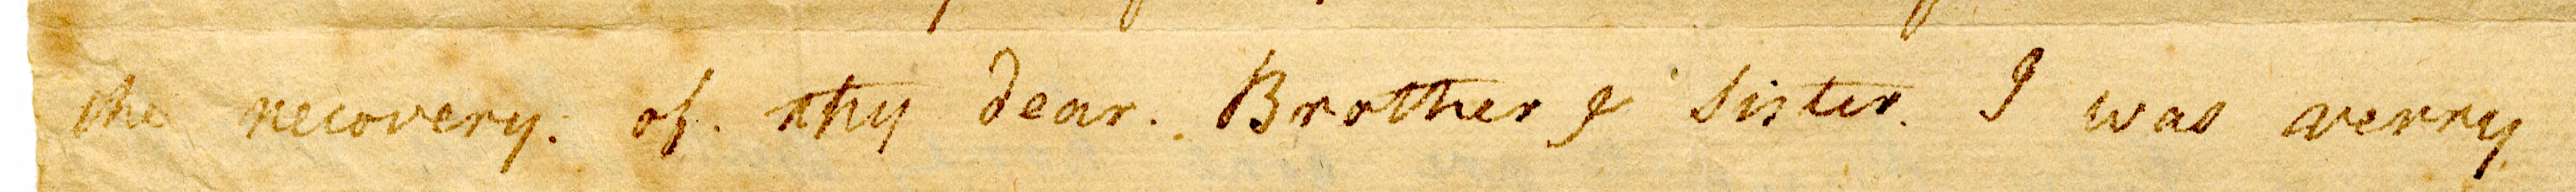the recovery of thy dear Brother & sister I was verry
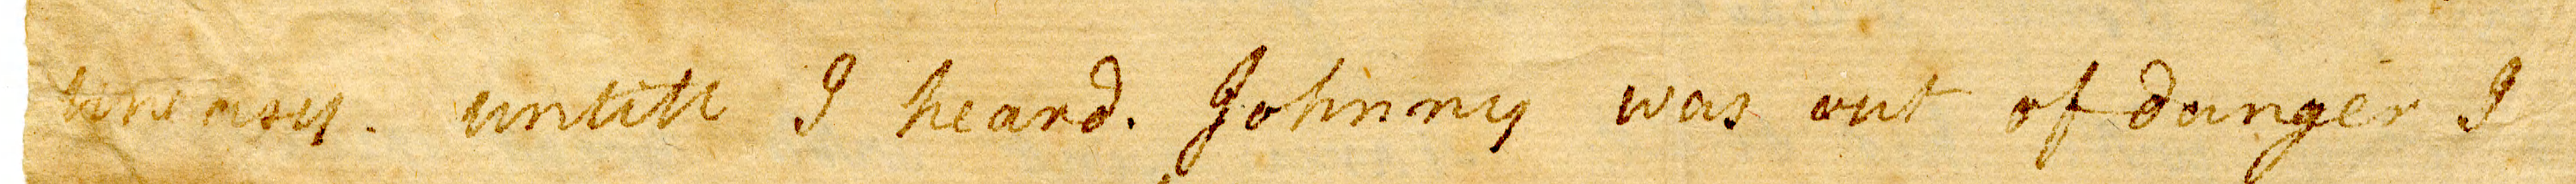uneasy until I heard Johnny was out of danger I
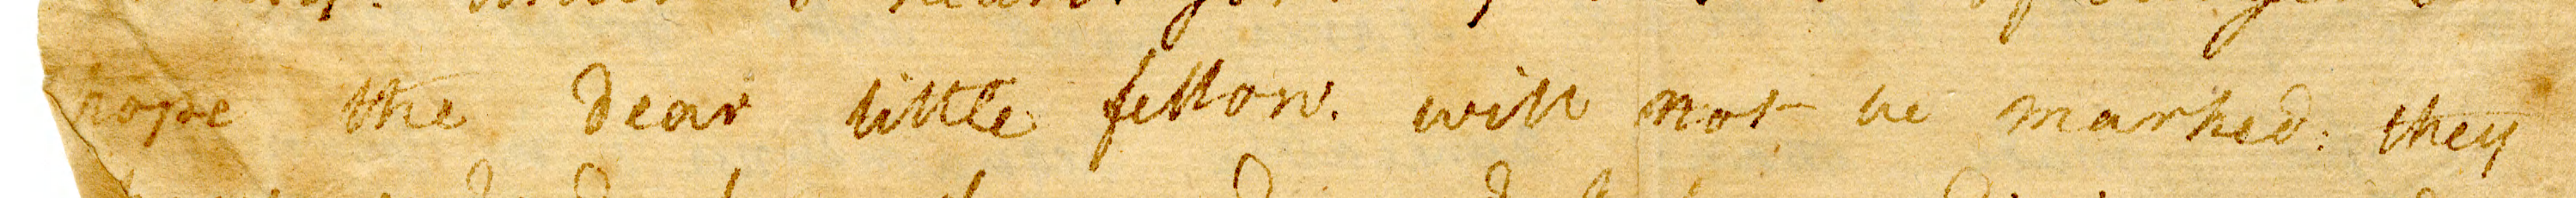hope the dear little fellow will not be marked: they
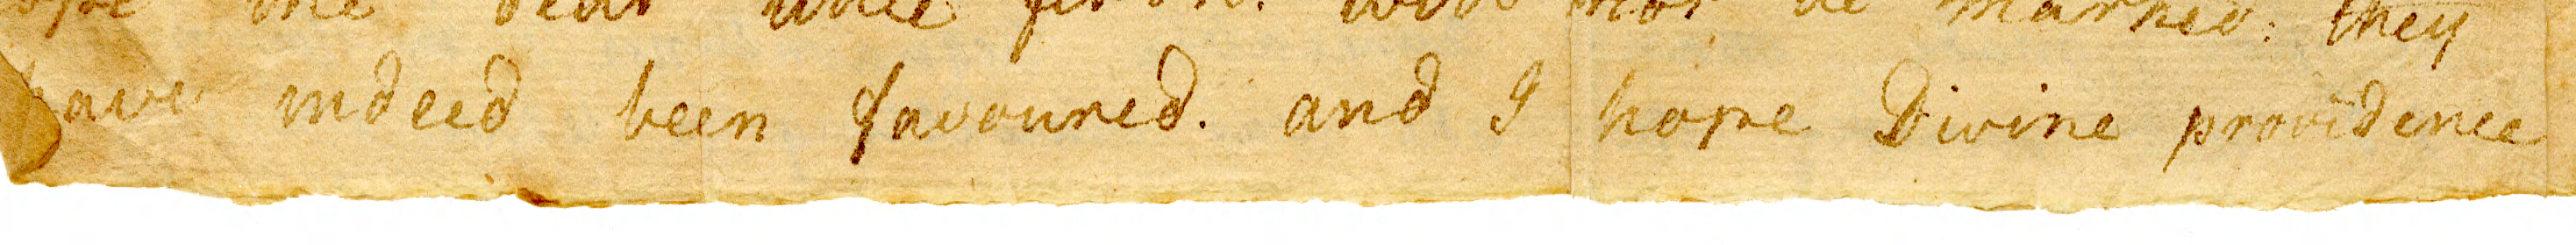ave indeed been favoured and I hope Divine providence
